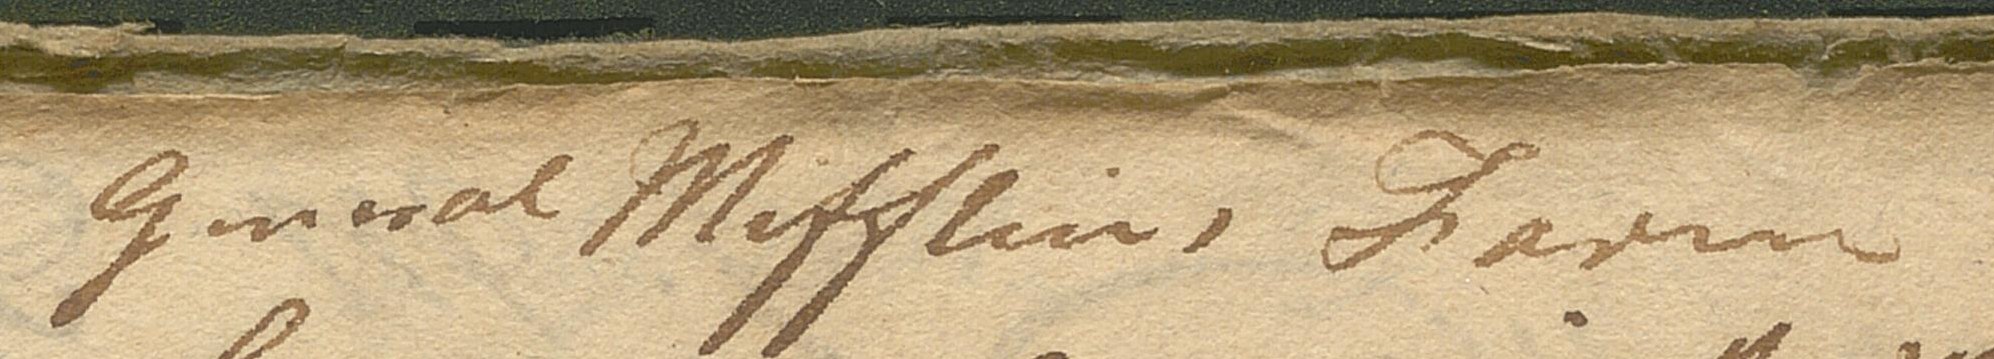General Mifflins Farm
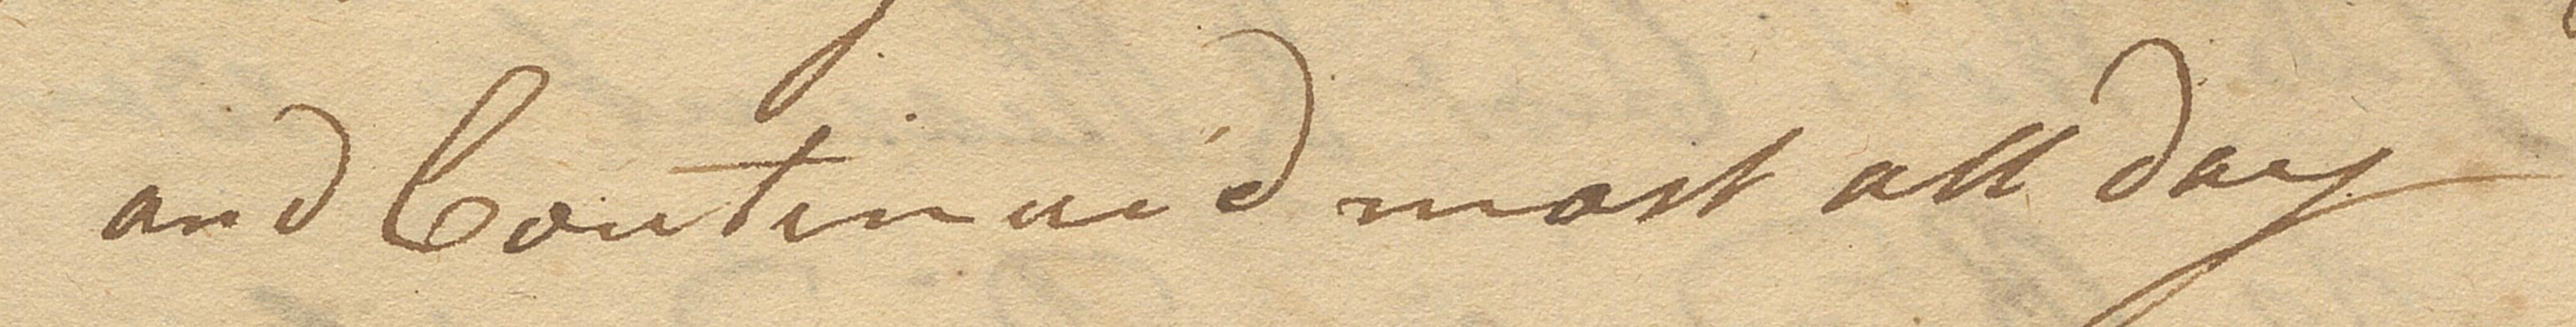and Continued most all day
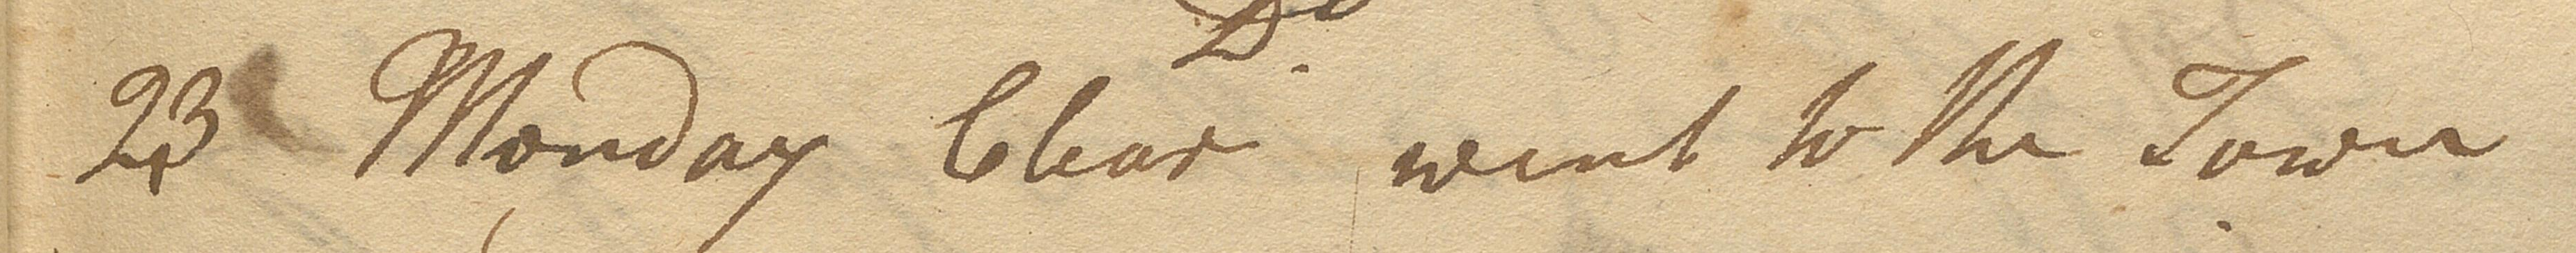23 Monday Clear went to the Town
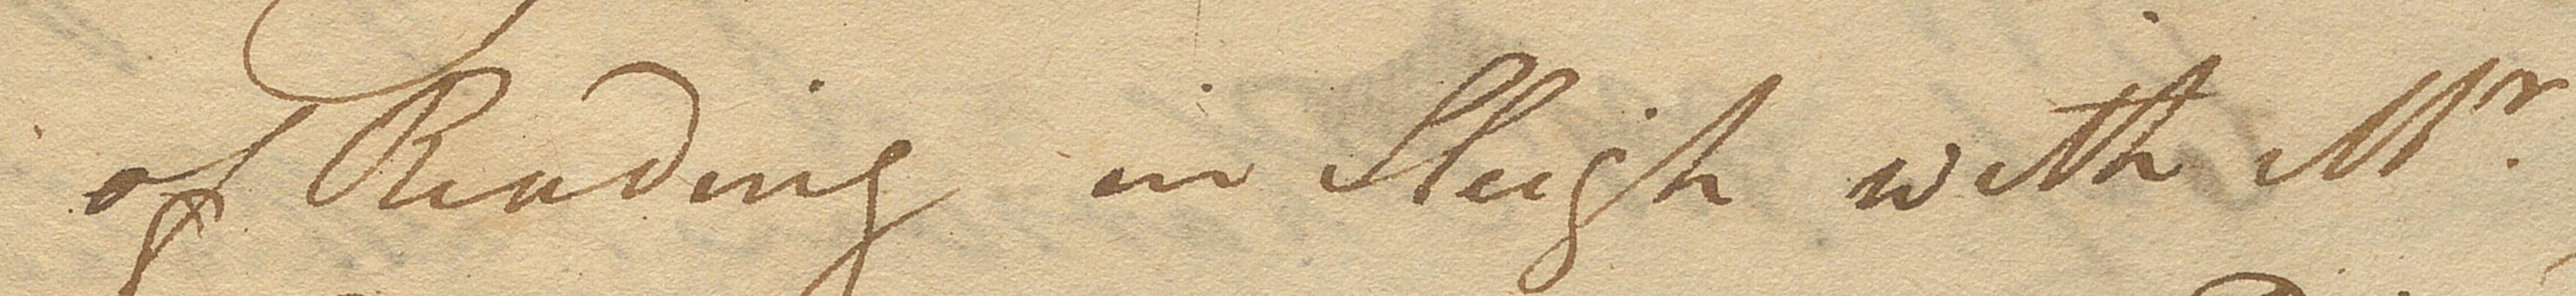of Reading, in Sleigh with M^r.
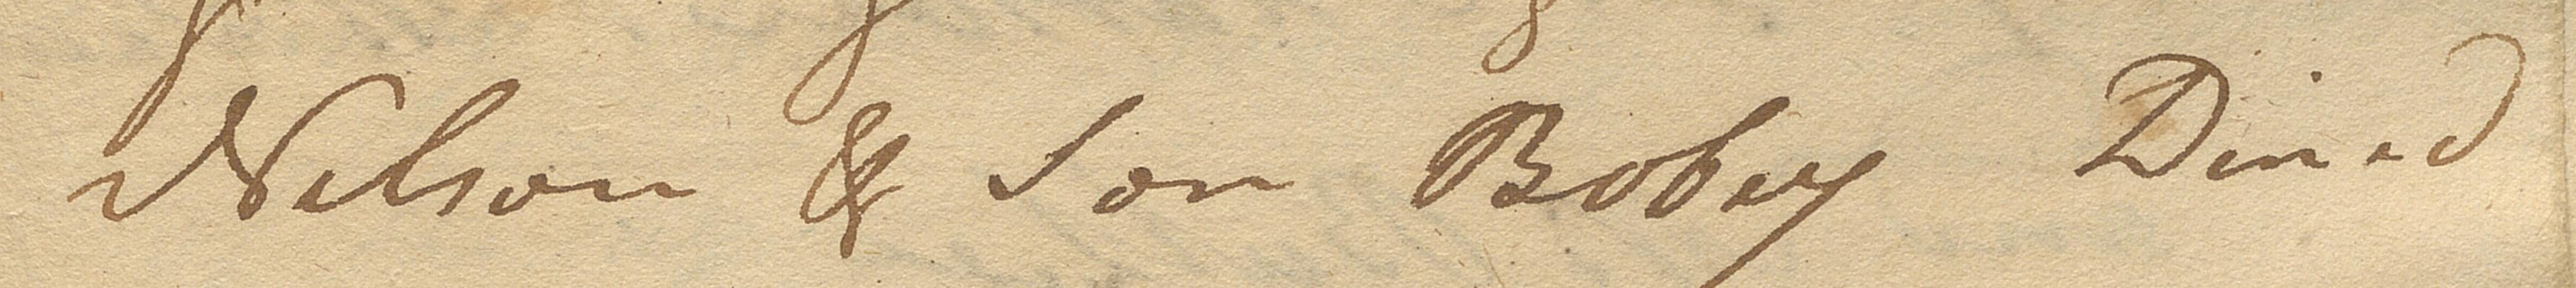Nelson & Son Bobey Dined
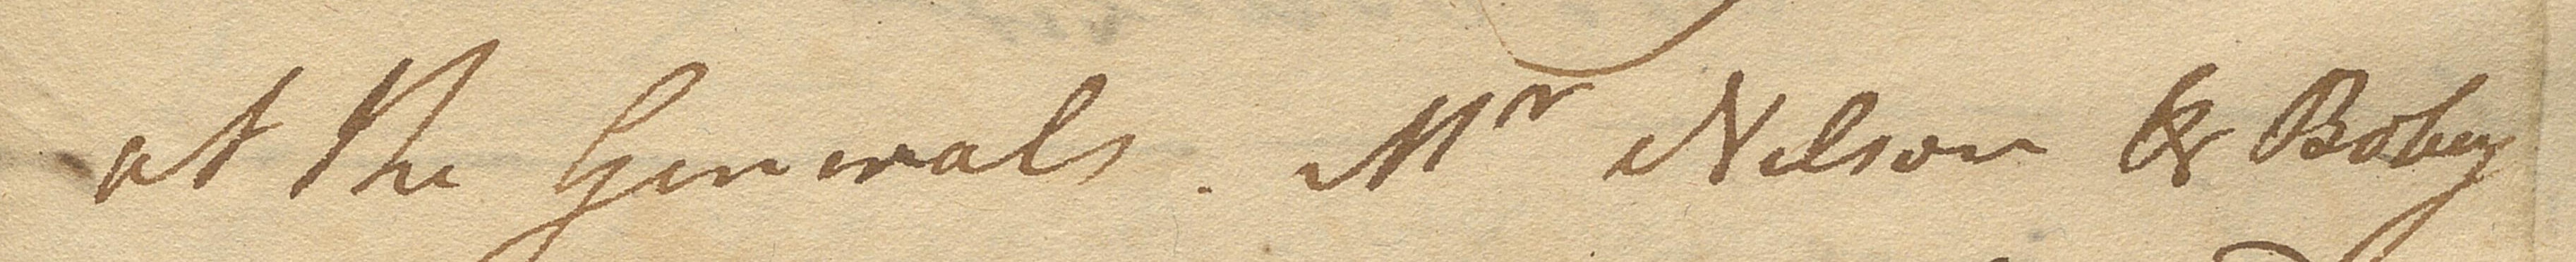at the Generals M^r. Nelson & Bobey
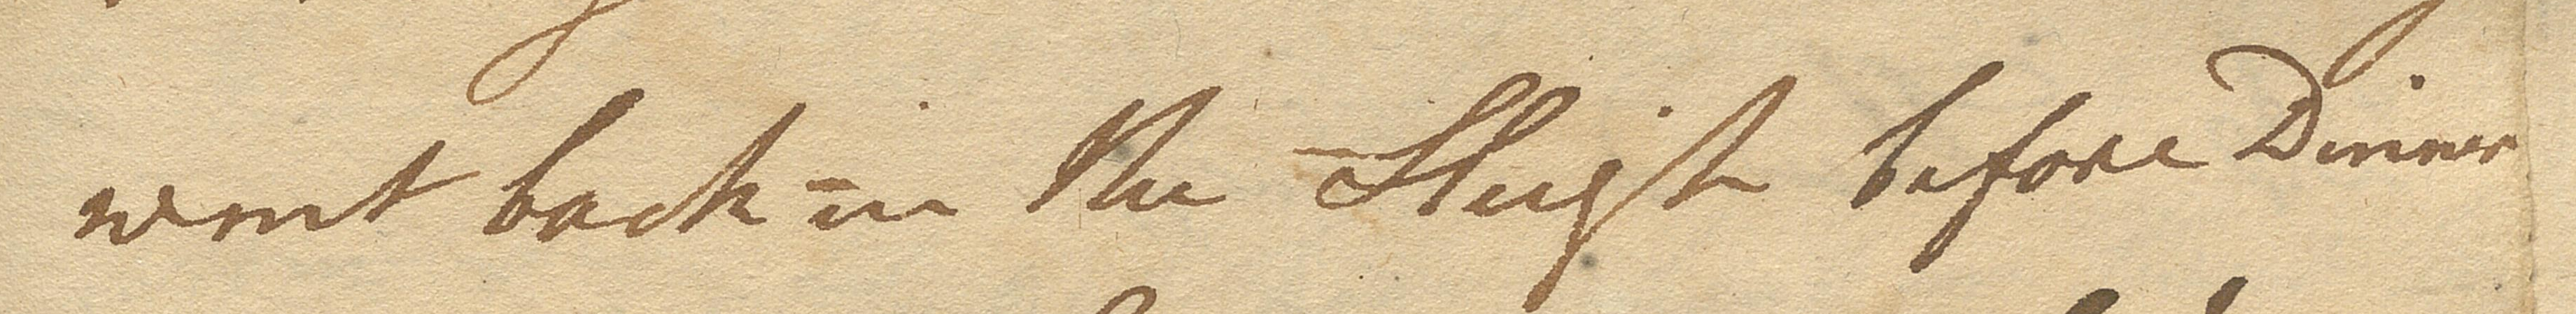went back in the Sleigh before Dinner
